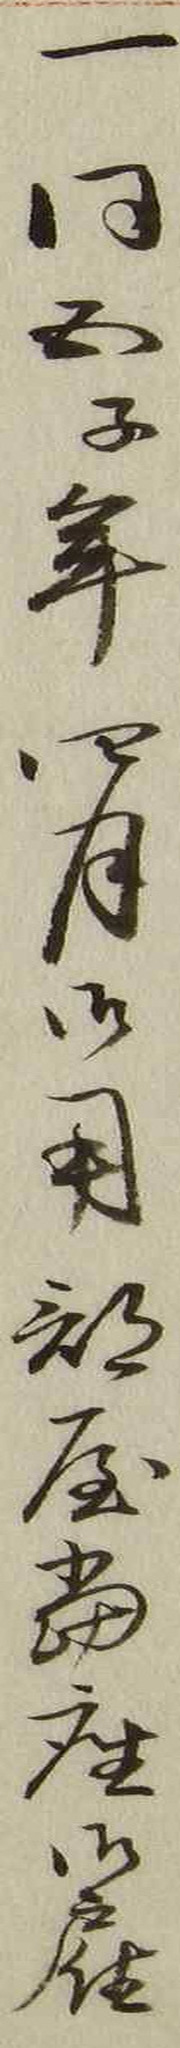一同五子年四月御用部屋当座御雇
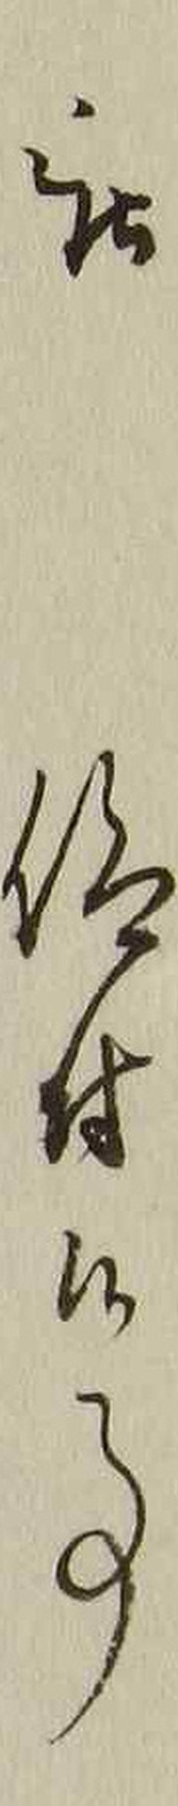被仰付候事
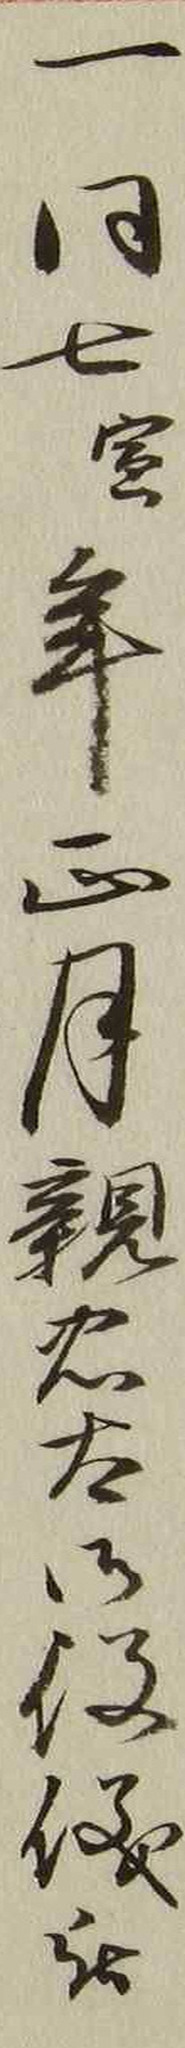一同七寅年正月親忠太御役儀被
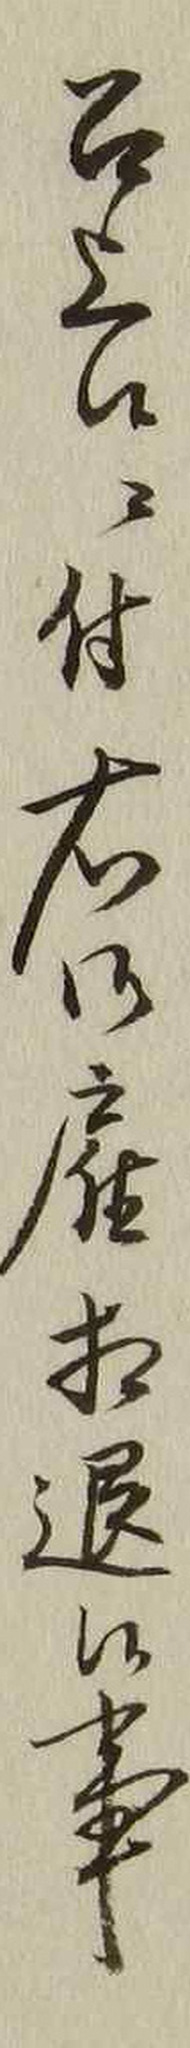召上候ニ付右御雇相退候事
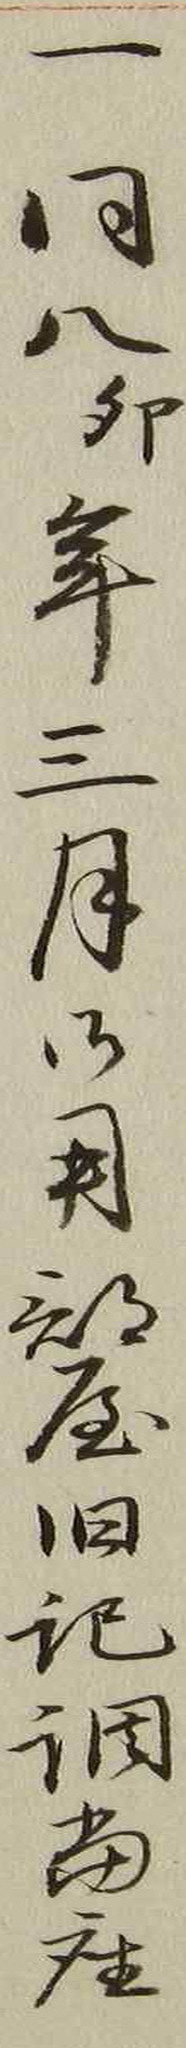一同八夘年三月御用部屋旧記調当座
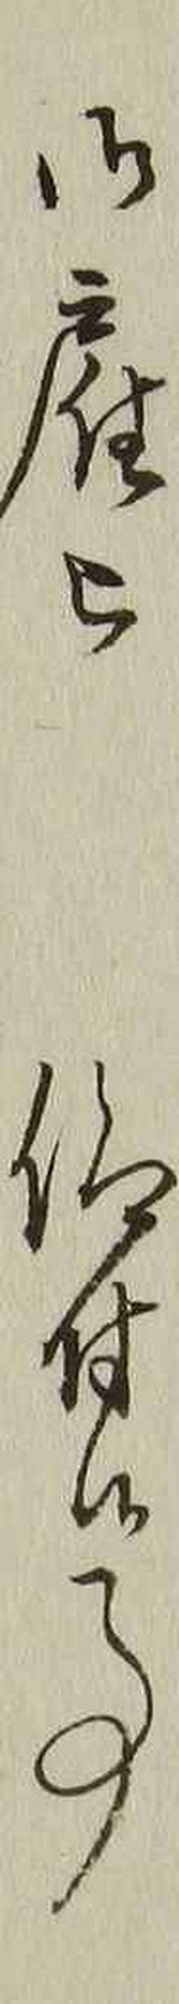御雇被仰付候事
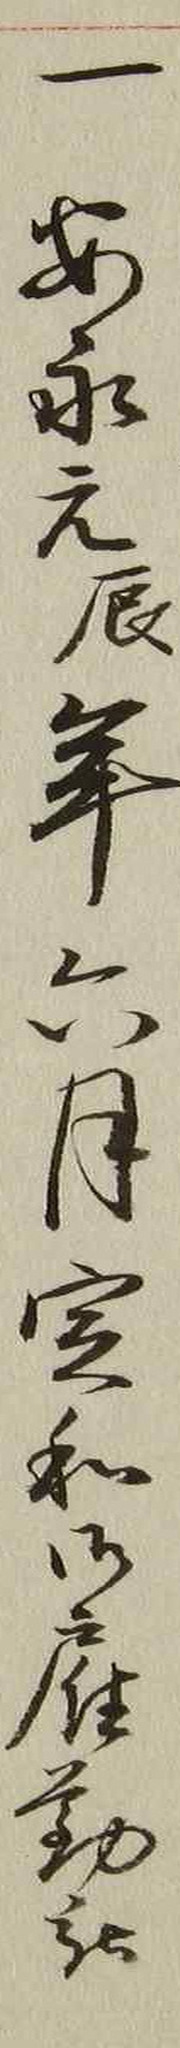一安永元辰年六月定和御雇勤被
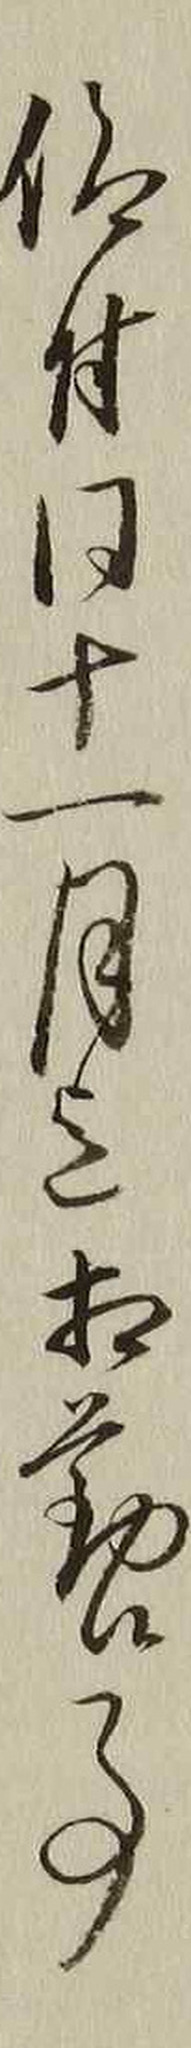仰付同十一月迄相勤候事
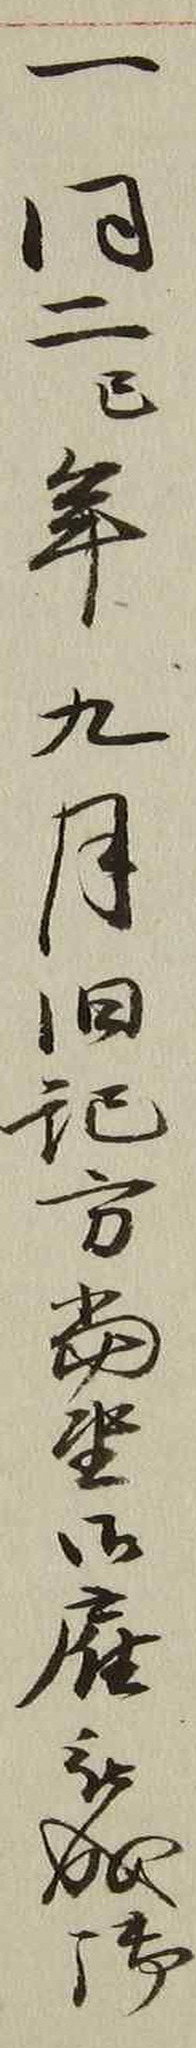一同ニ巳年九月旧記方当坐御雇被成御
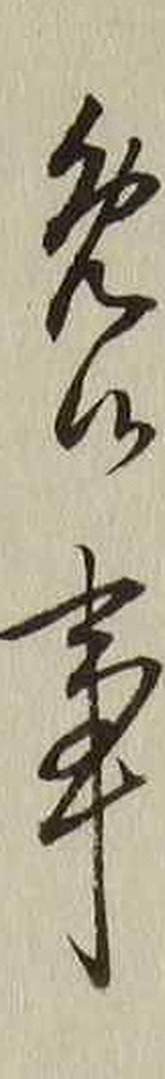免候事
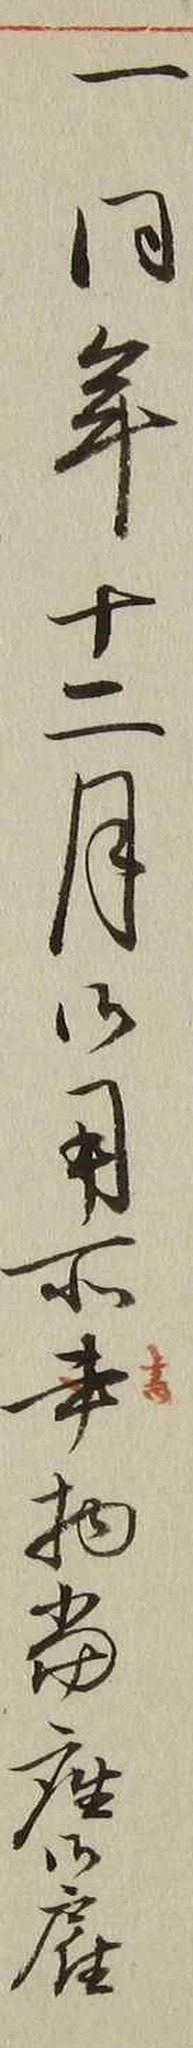一同年十二月御用所書物当座御雇
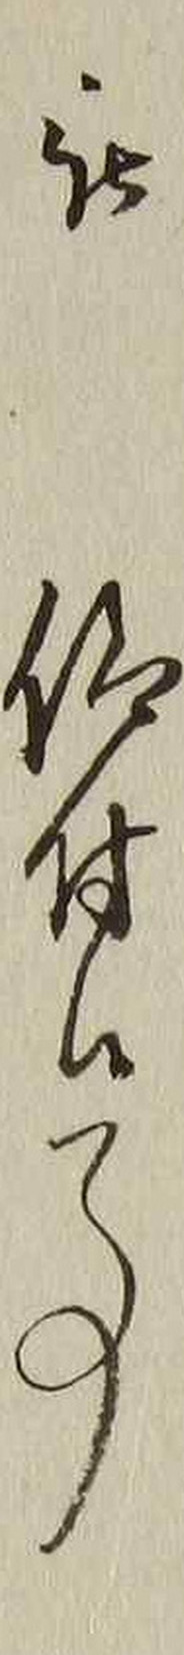被仰付候事
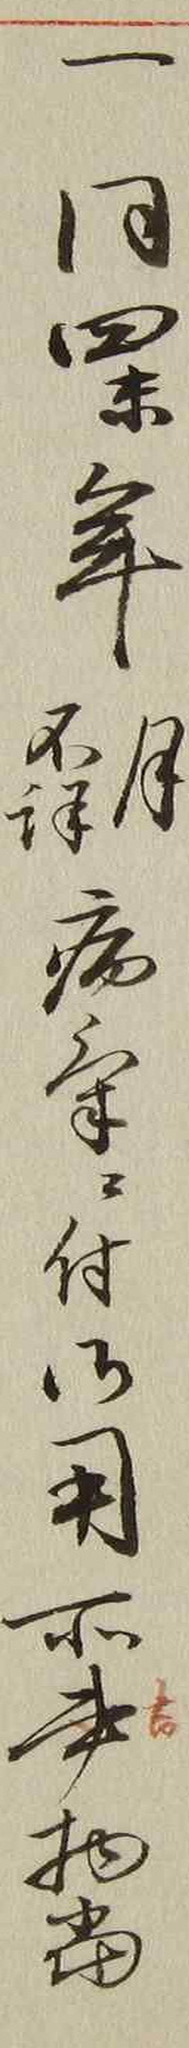一同四未年月不詳病気ニ付御用所書物当
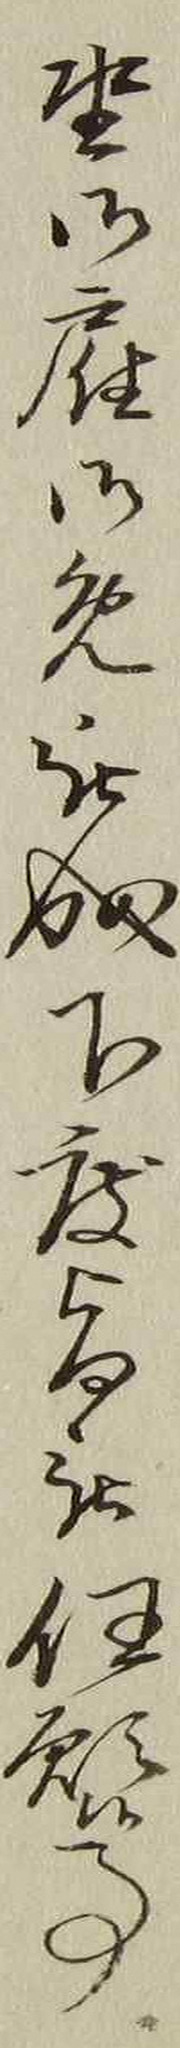坐御雇御免被成下度旨被伺願候事
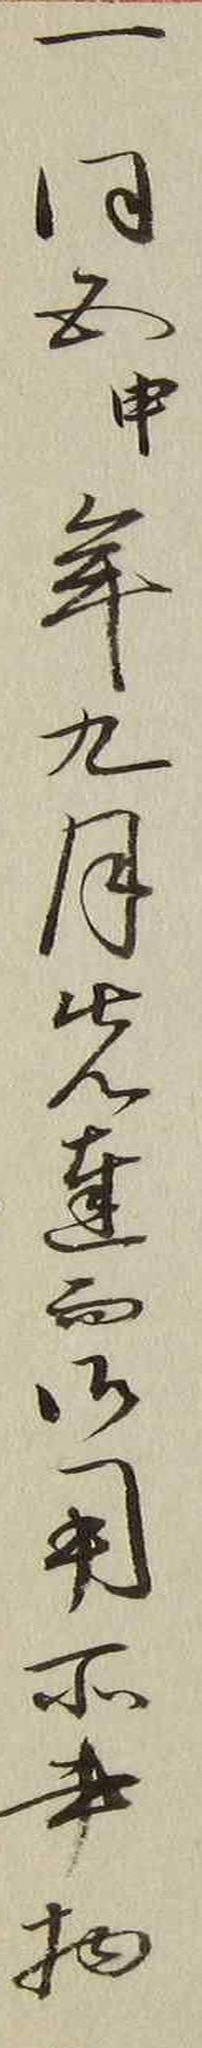一同五申年九月先達而御用所書物
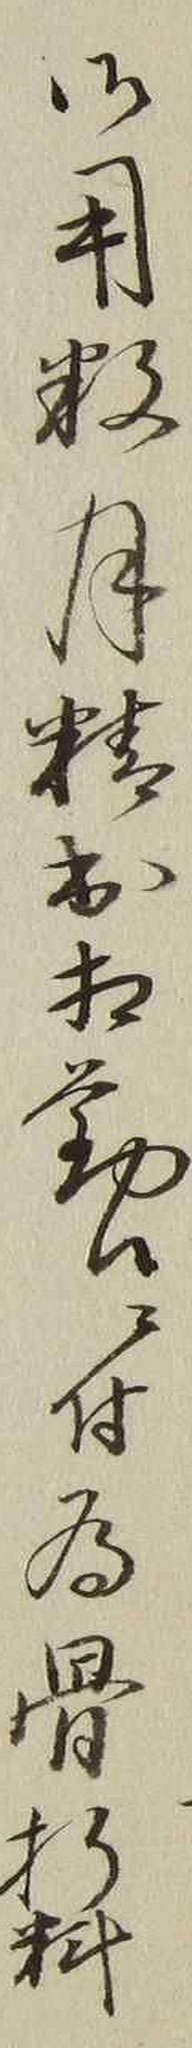御用数月精出勤候ニ付為骨折料
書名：諸士系譜　巻之114　か之部22
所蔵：会津若松市立会津図書館
